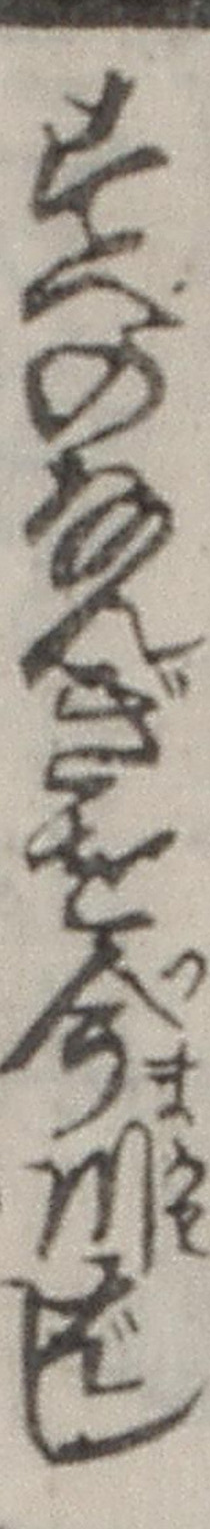すへのなんぎを今川ばし
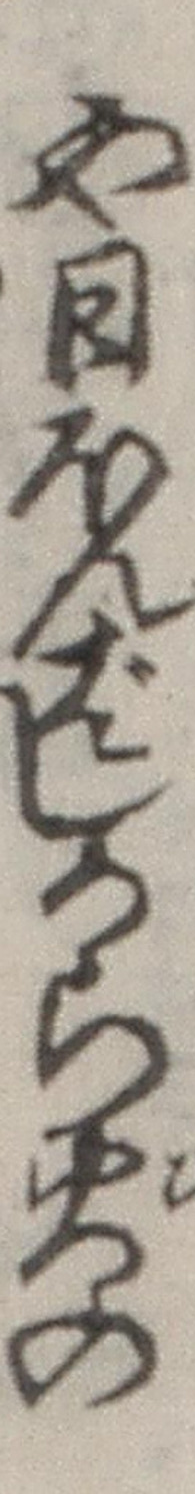や日ほんばしから火の
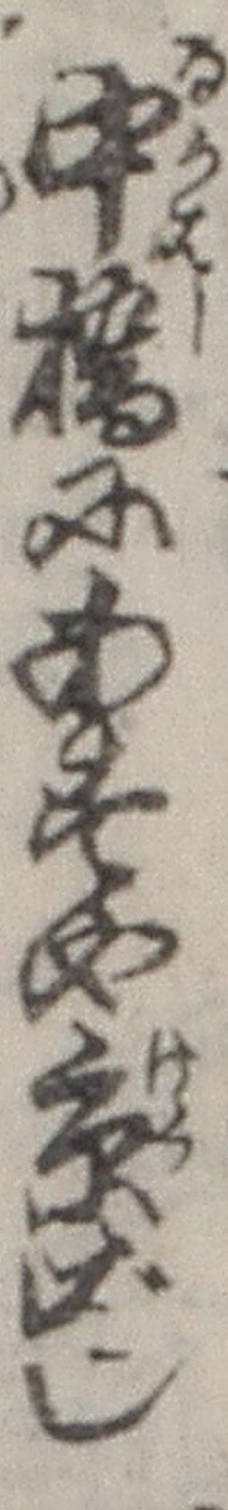中橋にあすや京ばし
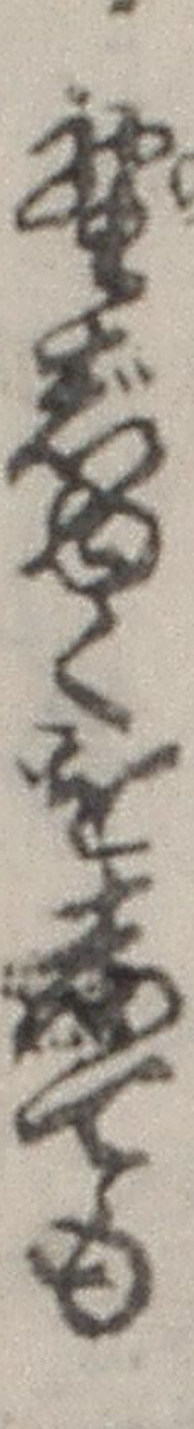野じゆくをしても
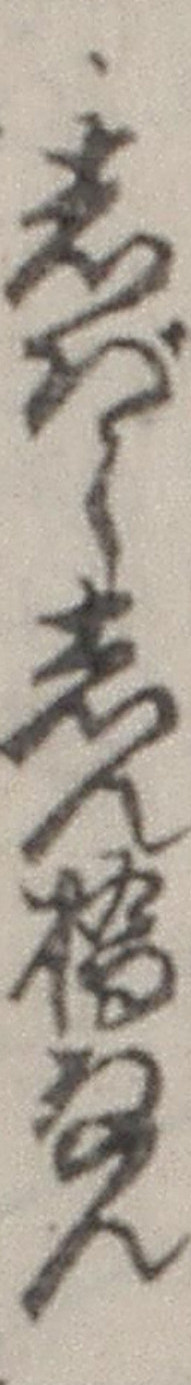しばししん橋なん
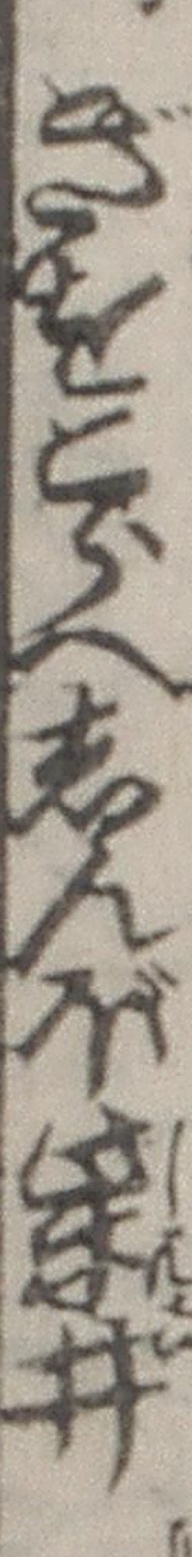ぎをこらへしんぼ柴井
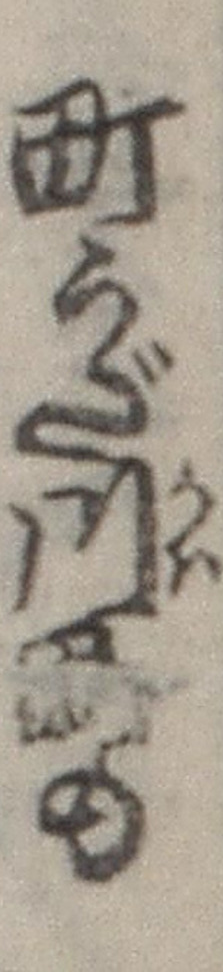町うだ川町も
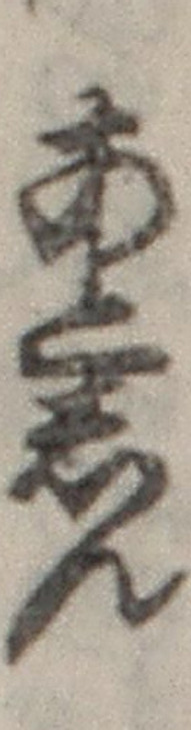あとしん
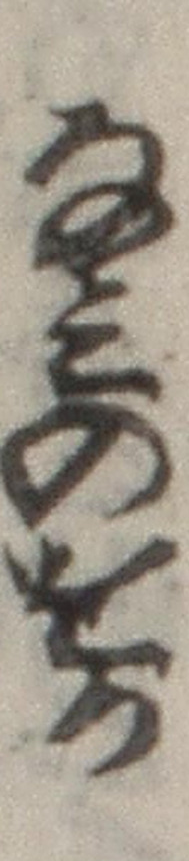なみのをか
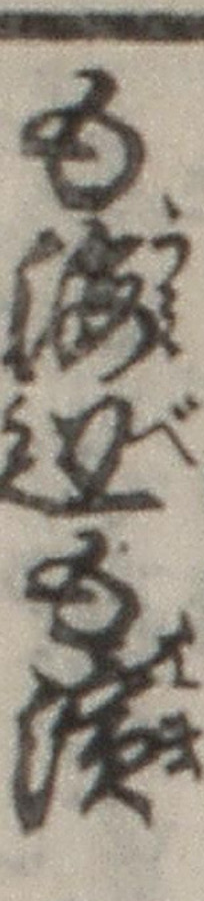も海辺も濱
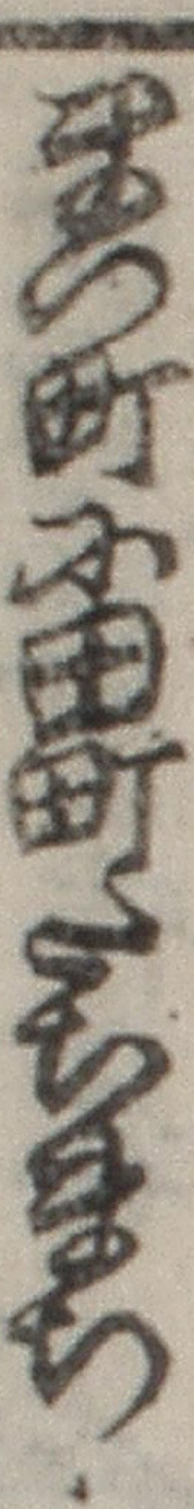まつ町に田町たちまち
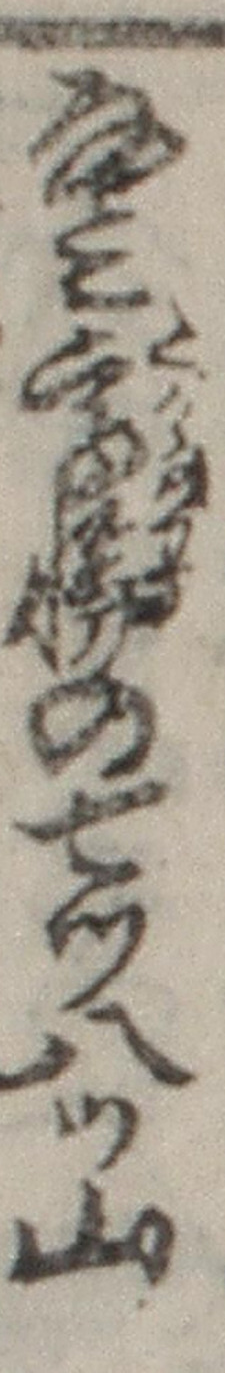なみ高輪の七つ八つ山
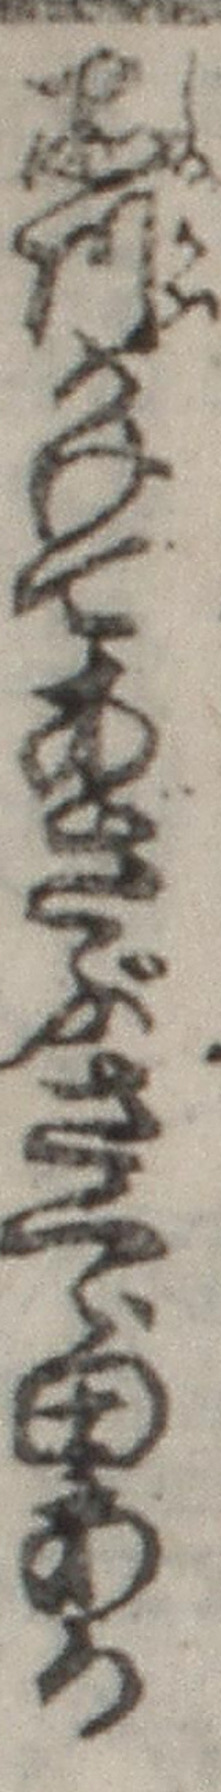品川かけてあさぶさくら田あか
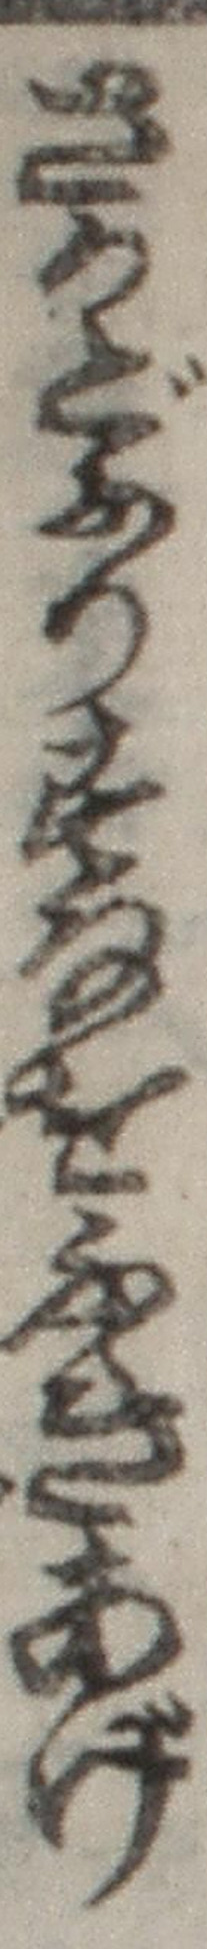さかどふりすなをふきあげ
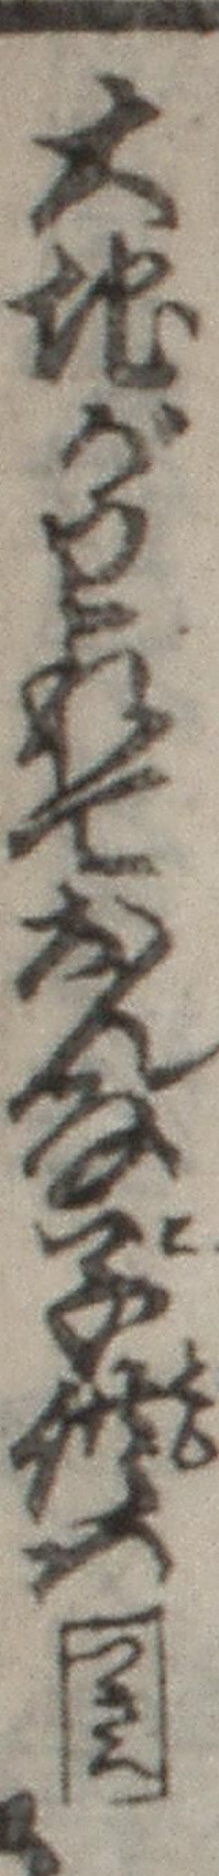大地がわれておんな子供はつぎへ

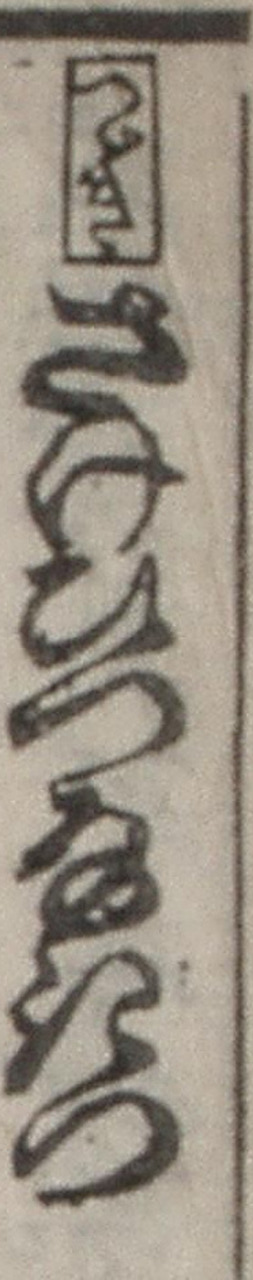つづきさけひつなきつ
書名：安政二卯年　江戸大地震并出火附
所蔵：東京大学地震研究所図書室 Earthquake Research Institute Library, The University of Tokyo, JAPAN
